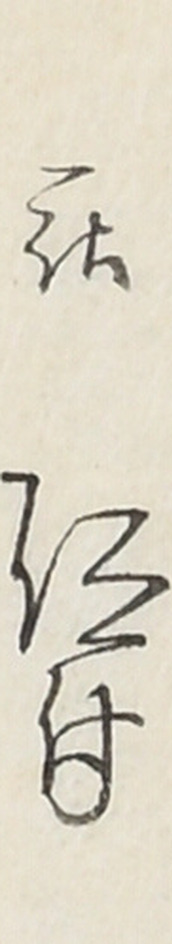被仰付
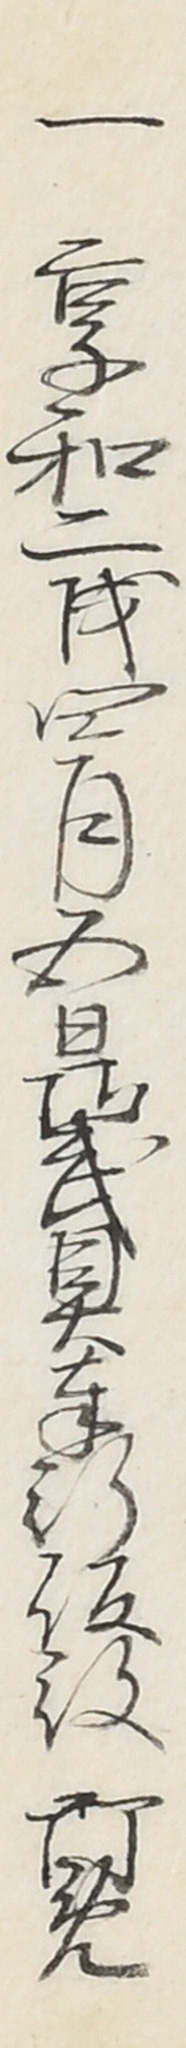一享和二戌四月五日御武具奉行仮役御免
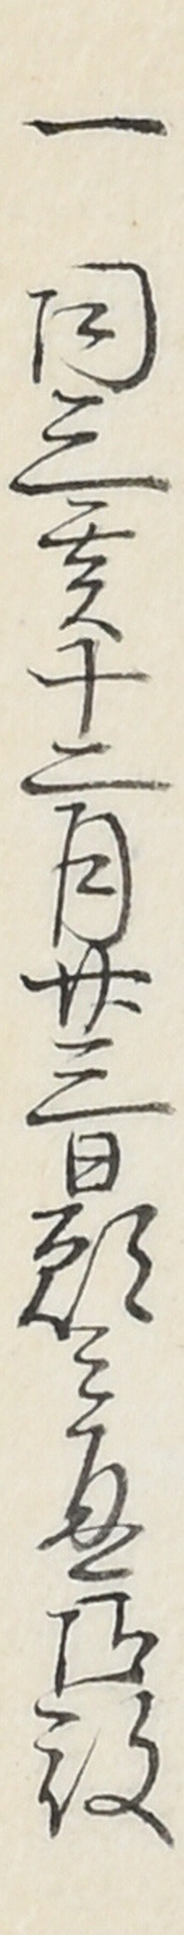一同三亥十二月廿三日願之通御役
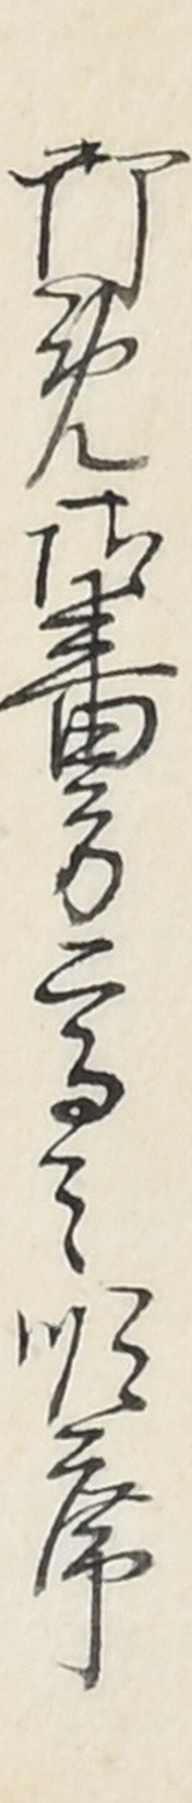御免御番方高之順席

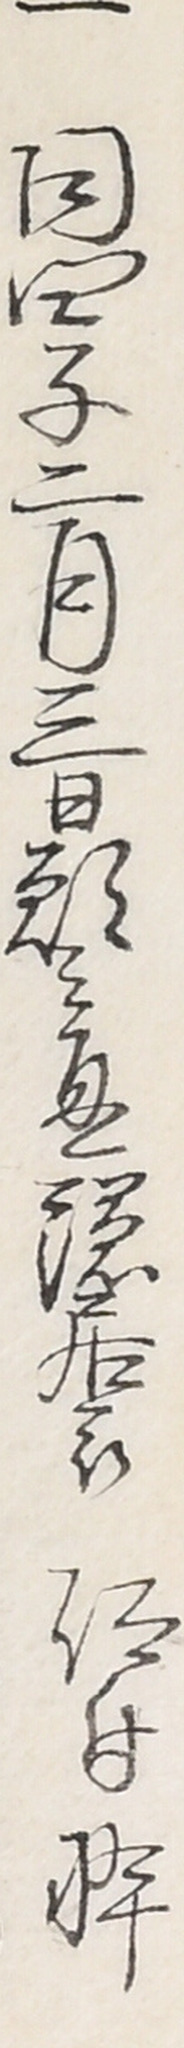一同四子二月三日願之通隠居被仰付忰
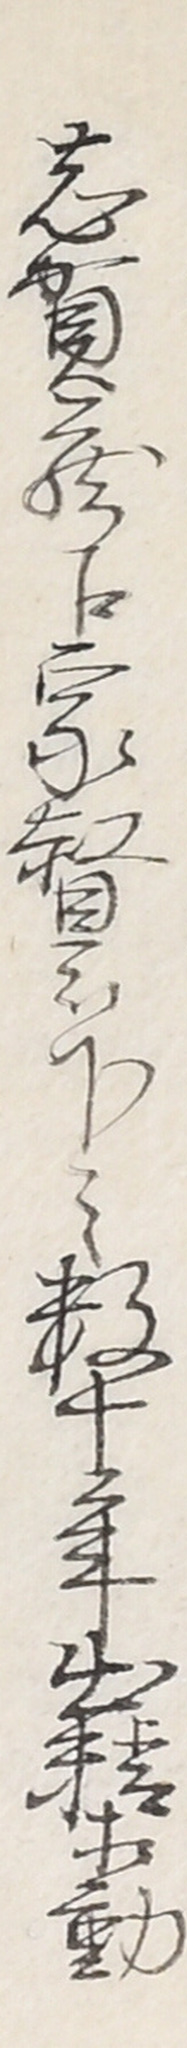志賀蔵江家督被下之数十年出精相勤
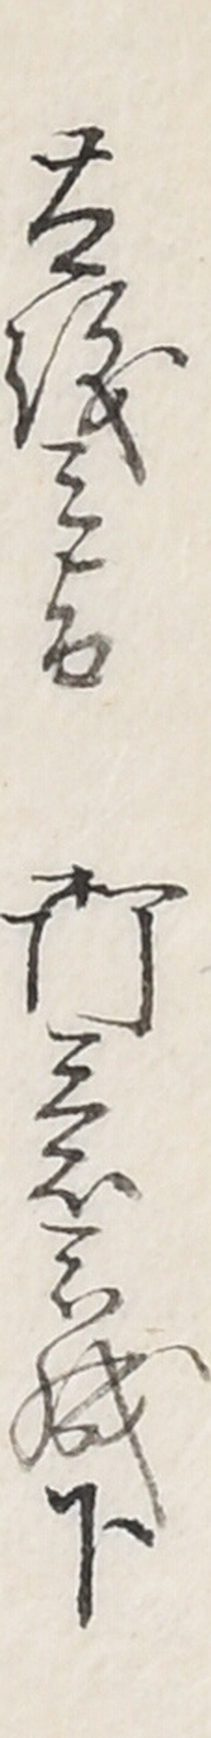太儀之旨御意被成下
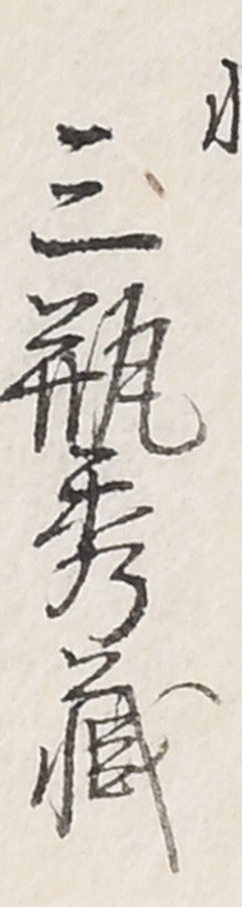三瓶秀蔵
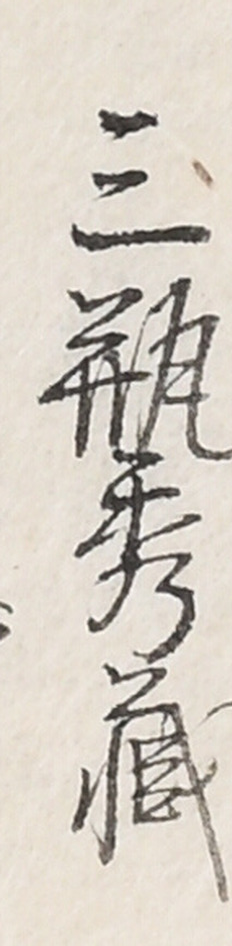三瓶秀蔵
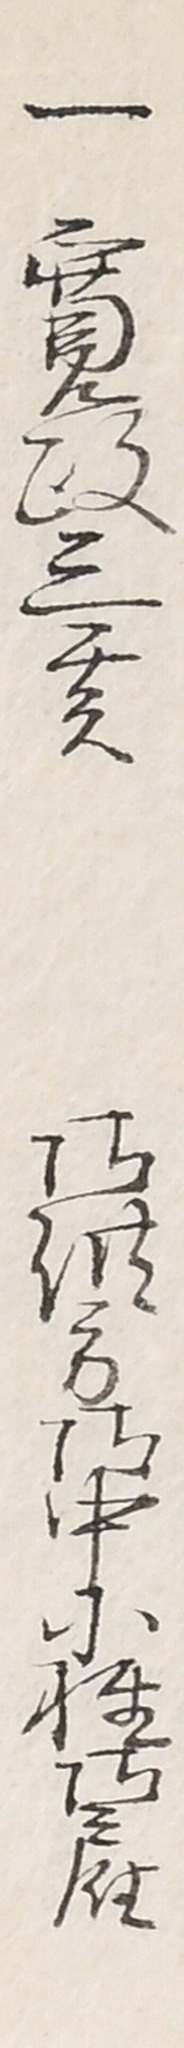一寛政三亥御供方御中小姓御雇
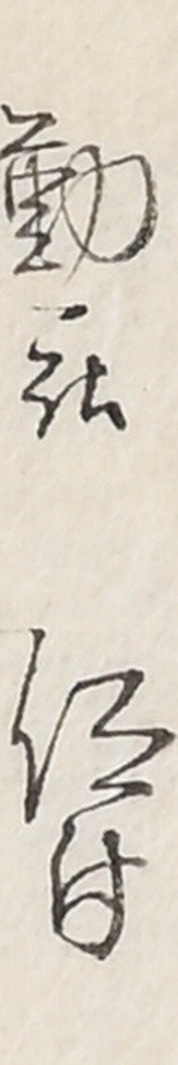勤被仰付
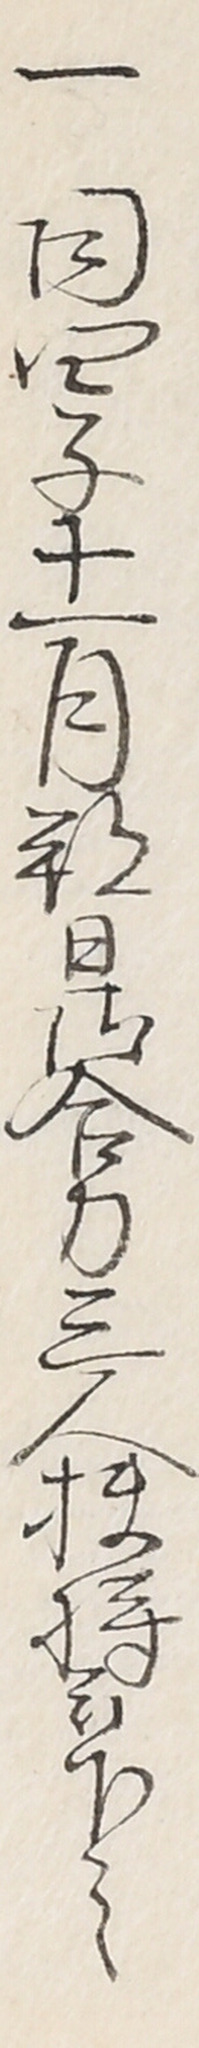一同四子十一月朔日御合力三人扶持被下之
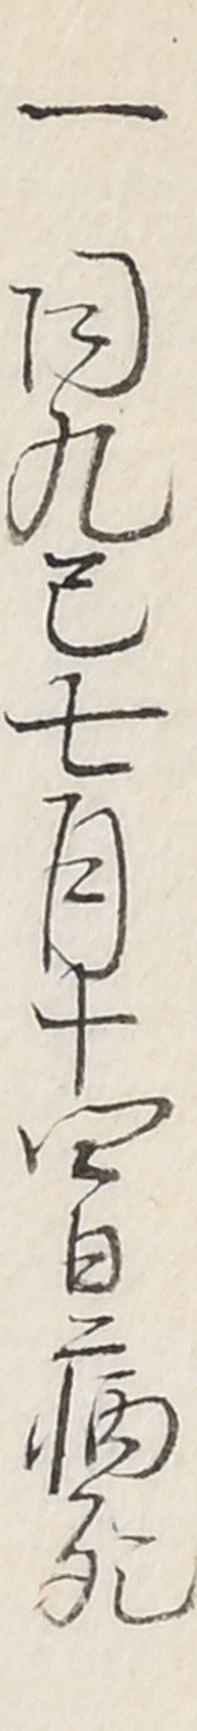一同九巳七月十四日病死
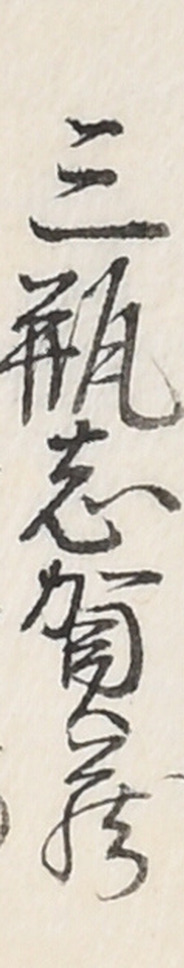三瓶志賀蔵
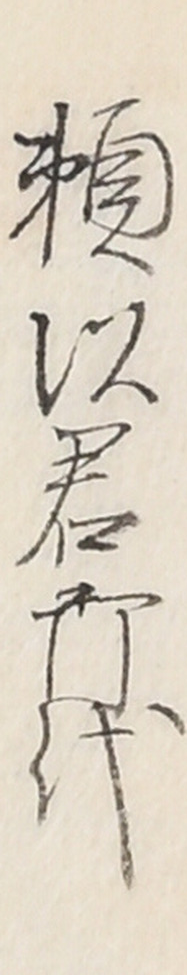頼以君御代
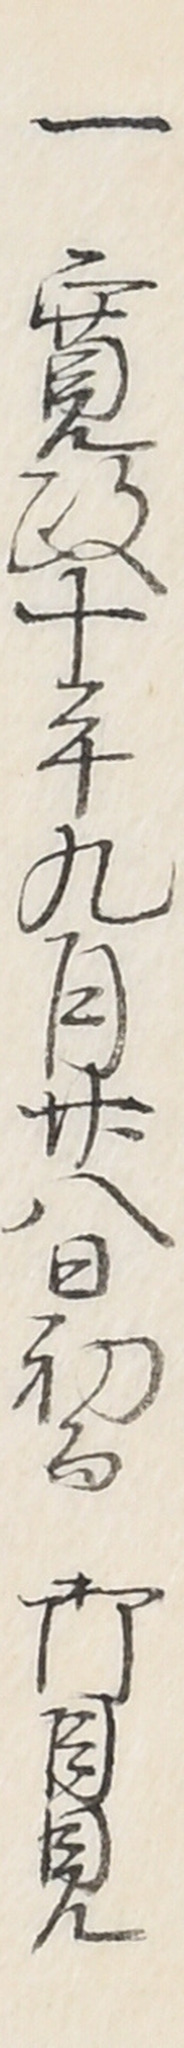一寛政十午九月廿八日初而御目見
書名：給人諸士勤仕録（七）
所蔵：伊那市立高遠町図書館・合同会社AMANE
